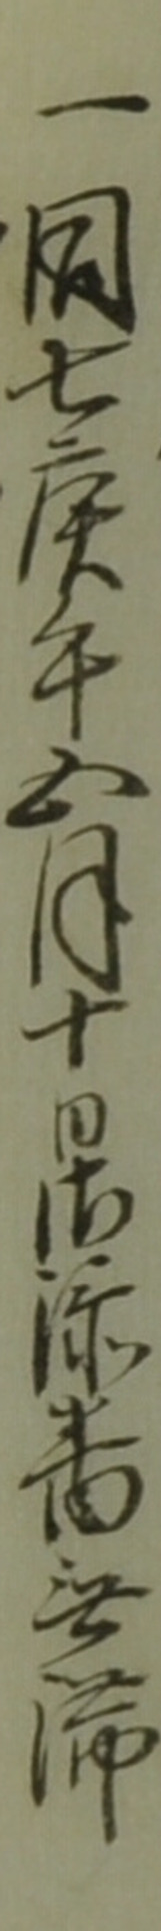一同七庚午五月十日御添番無滞
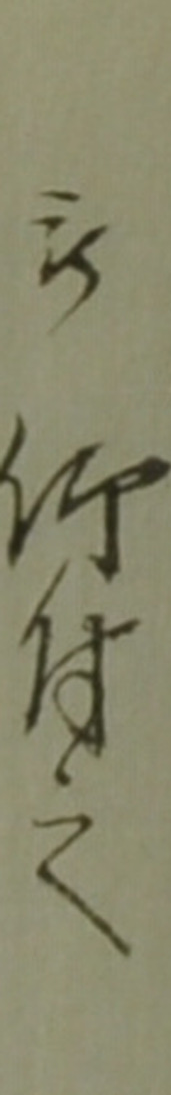被仰付之

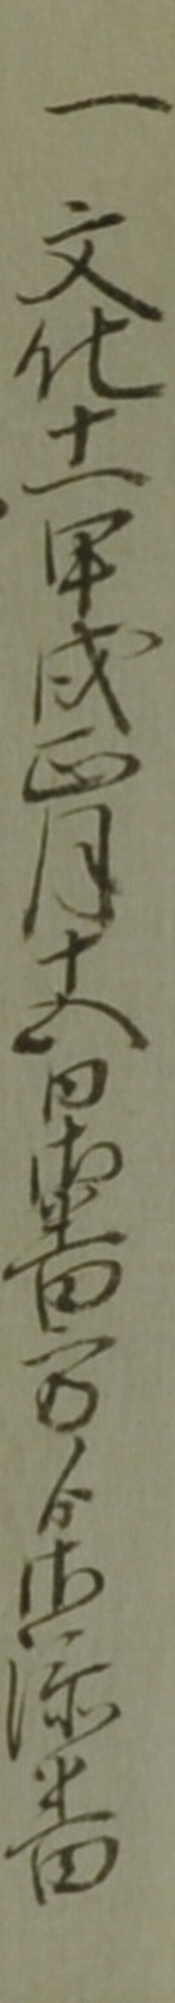一文化十一甲戌正月十五日御番方より御添番
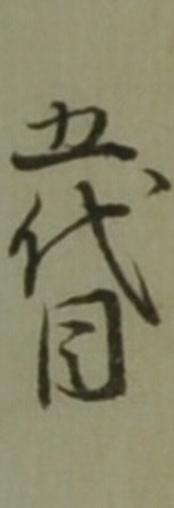五代目
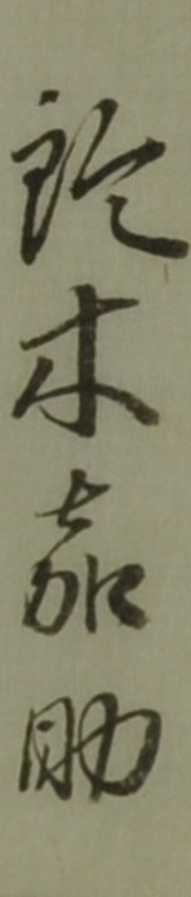鈴木嘉助
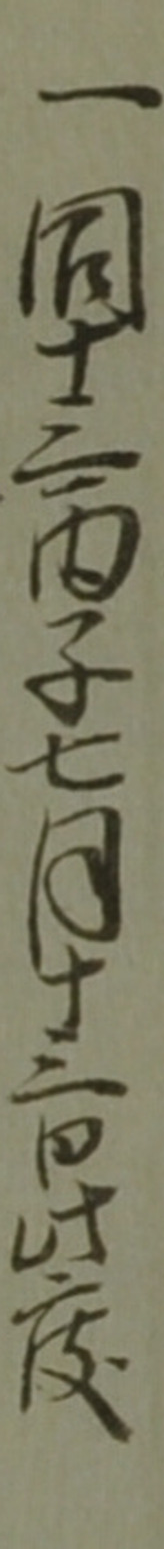一同十三丙子七月十三日此度
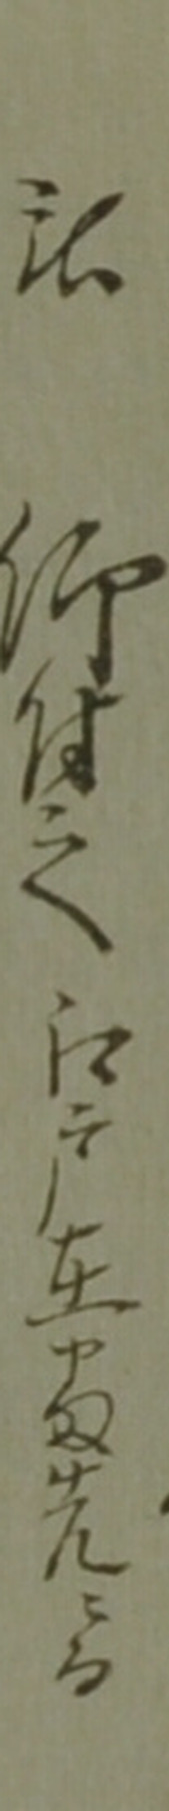被仰付之江戸在番先にて
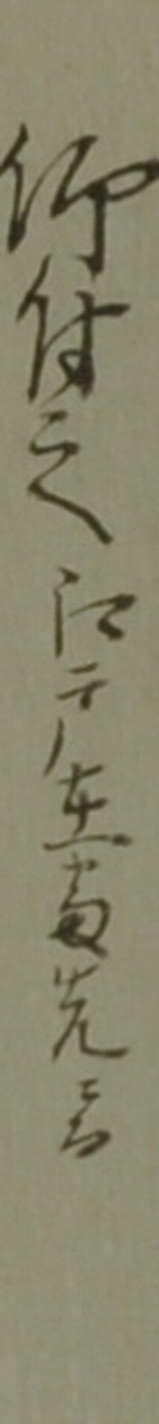被仰付之江戸在番先にて
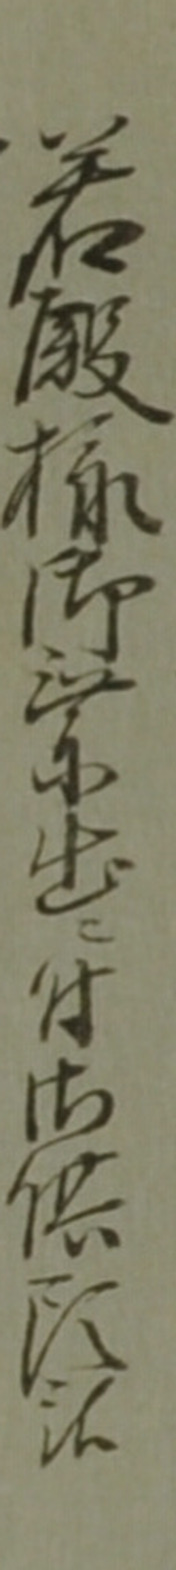若殿様御乗出に付御供頭被
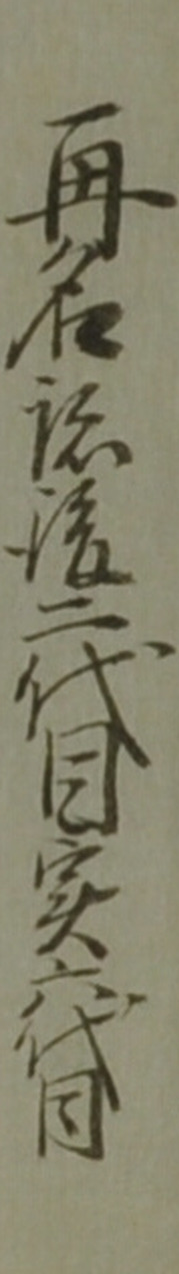再名跡後二代目実六代目
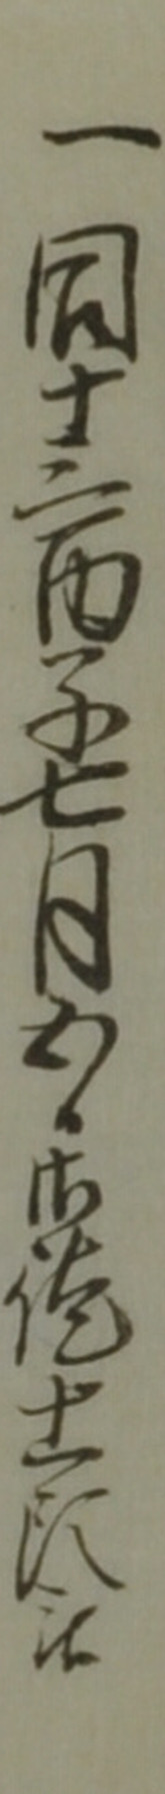一同十三丙子七月五日御徒士頭被
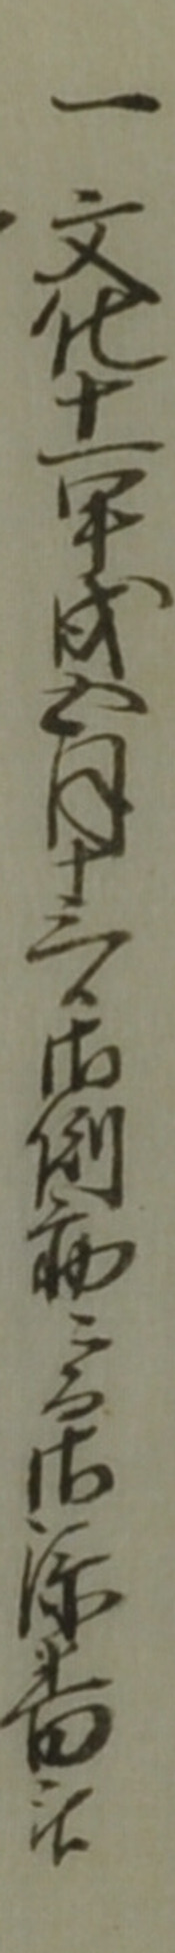一文化十一甲戌正月十三日御側勤にて御添番
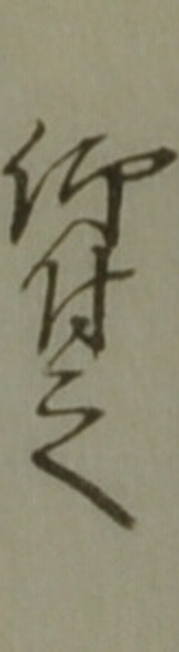仰付之
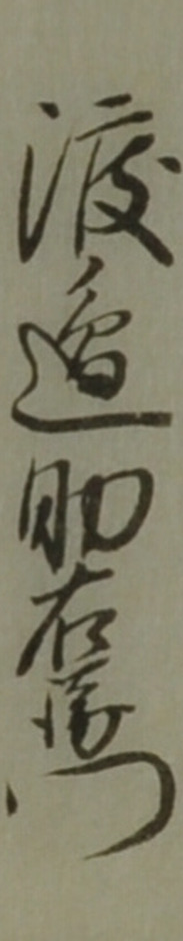渡邊助右衛門
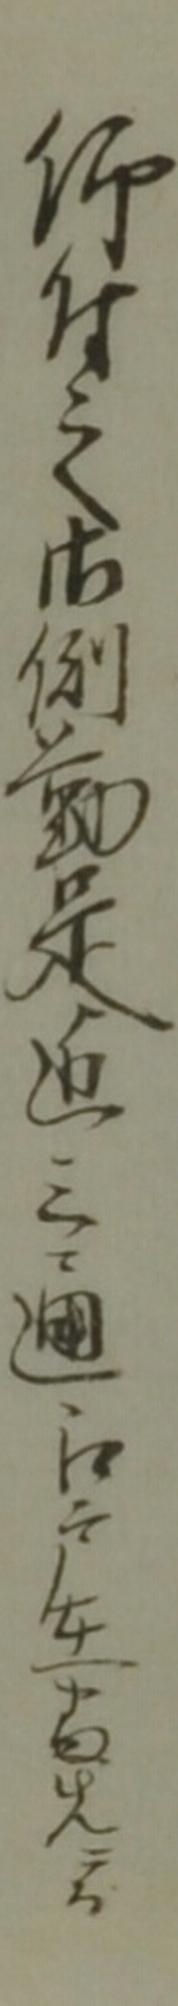仰付之御側勤是迄之通江戸在番先にて
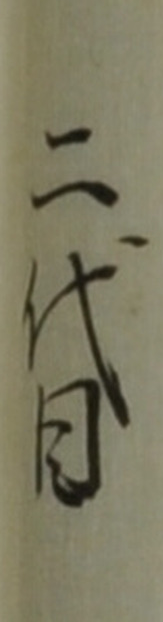二代目
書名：諸御役代々録（八）
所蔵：伊那市立高遠町図書館・合同会社AMANE
